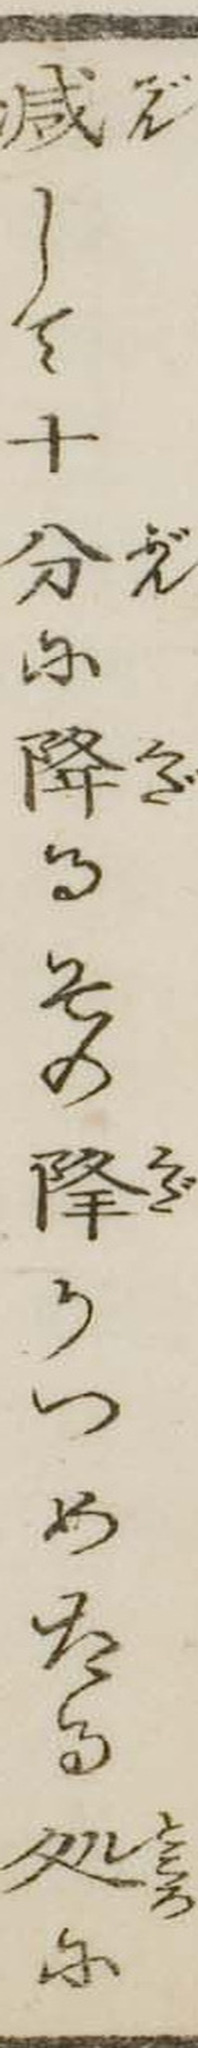減して十分に降るその降りつめたる処に
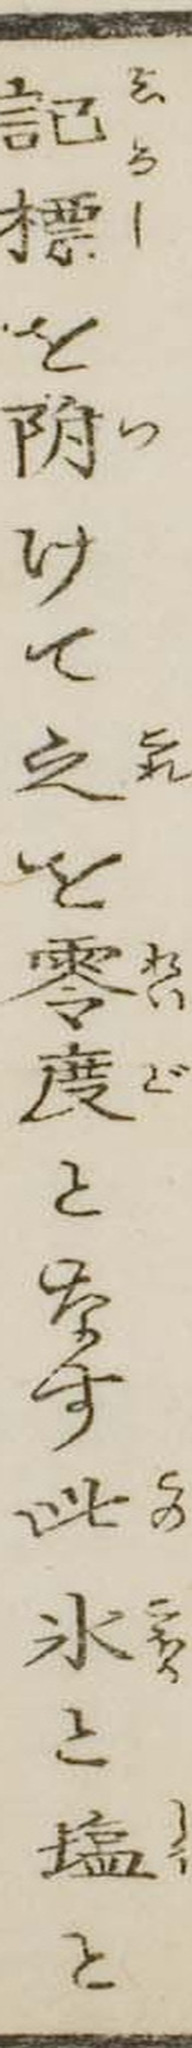記標を附けて之を零度となす此氷と塩と
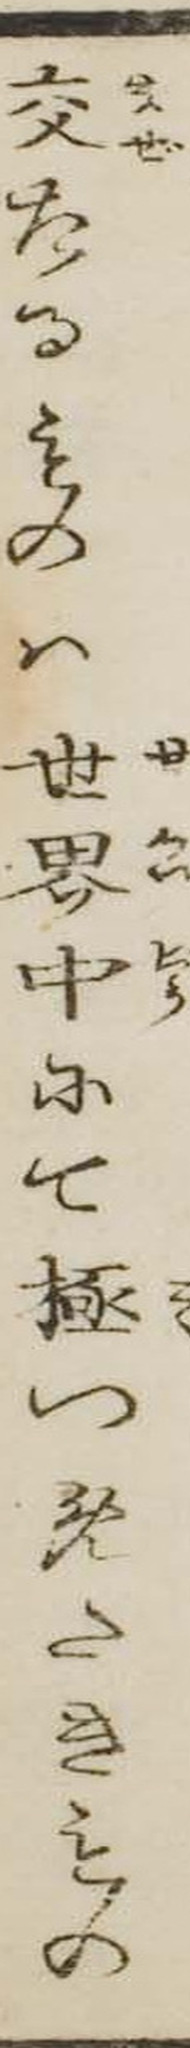交たるものは世界中にて極つめたきもの

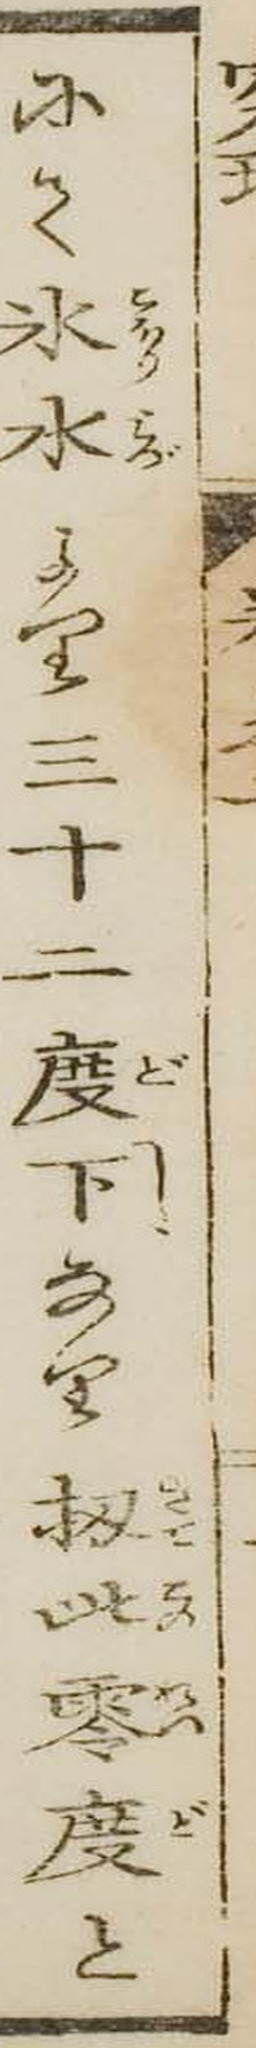にて氷水より三十二度下なり扨此零度と
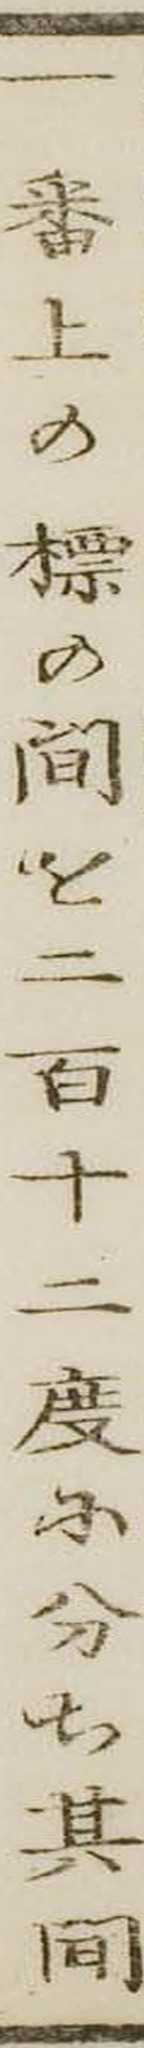一番上の標の間を二百十二度に分ち其間
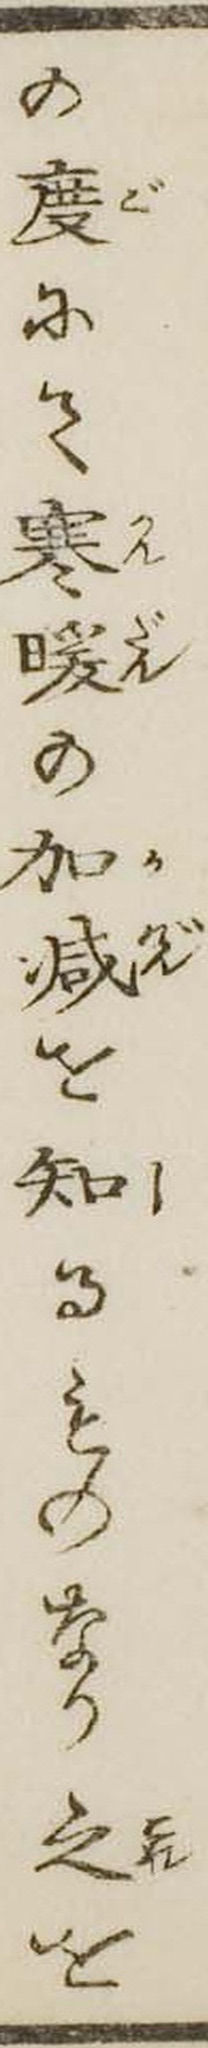の度にて寒暖の加減を知るものなり之を
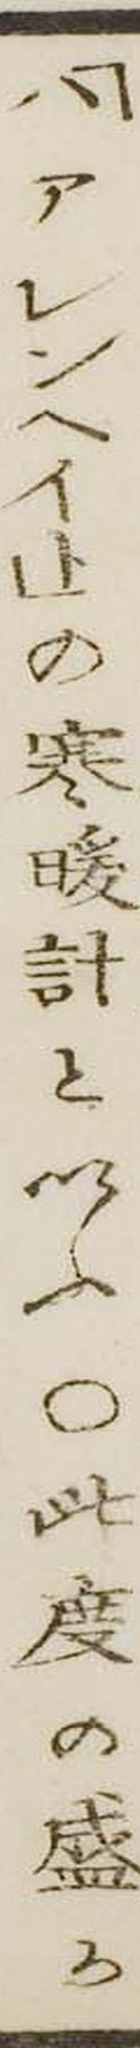「ハァレンヘイト」の寒暖計といふ◯此度の盛か
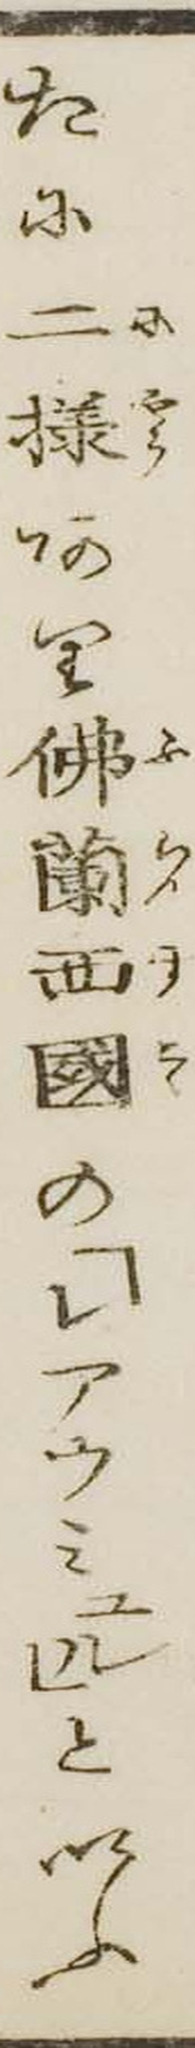たに二様あり仏蘭西國の「レアウミュル」といふ
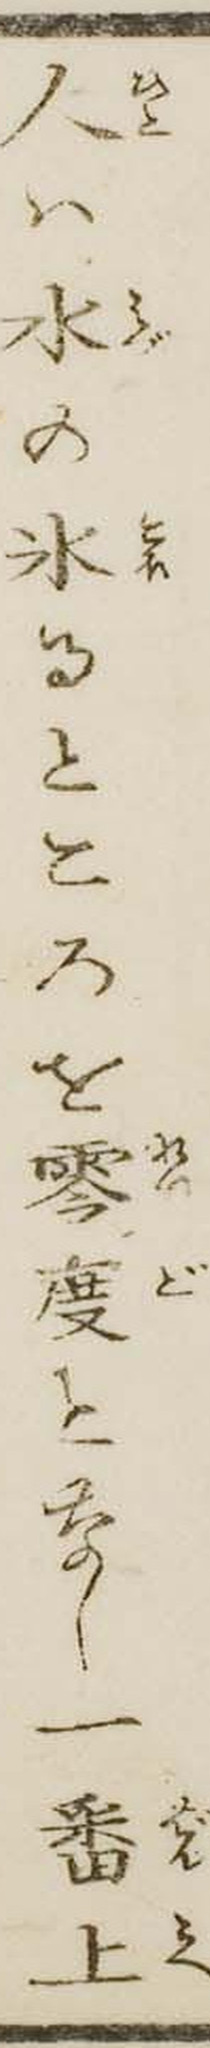人は水の氷るところを零度となし一番上
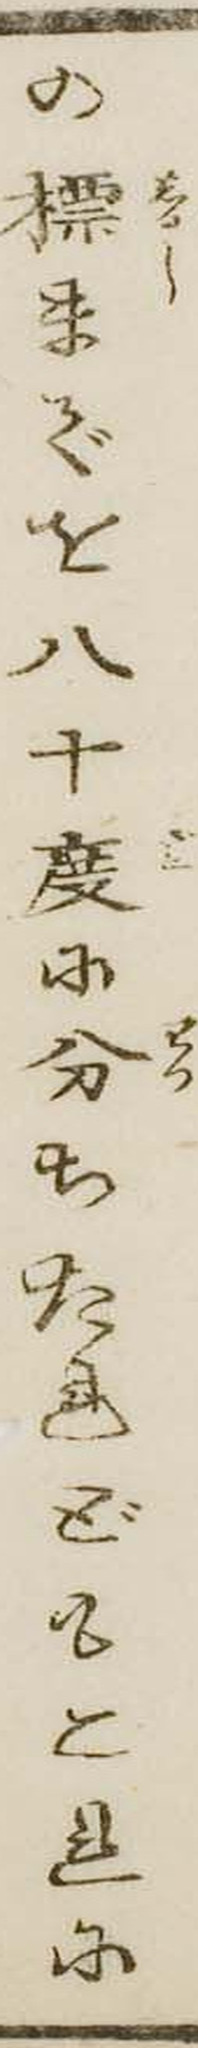の標までを八十度に分ちたれどもこれに
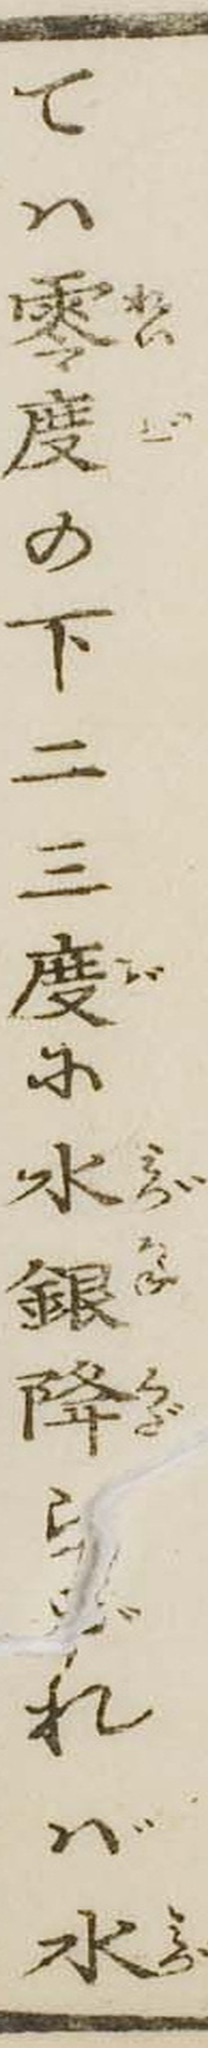ては零度の下二三度に水銀降らざれば水
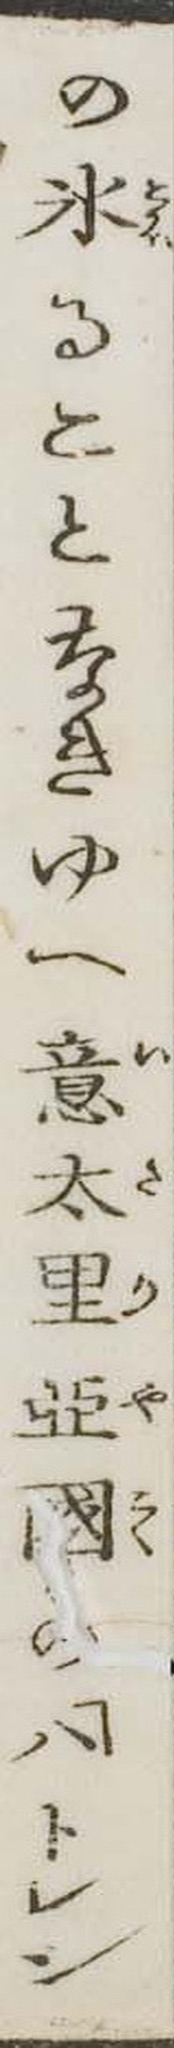の氷ることなきゆへ意太理亜國の「ハトレン
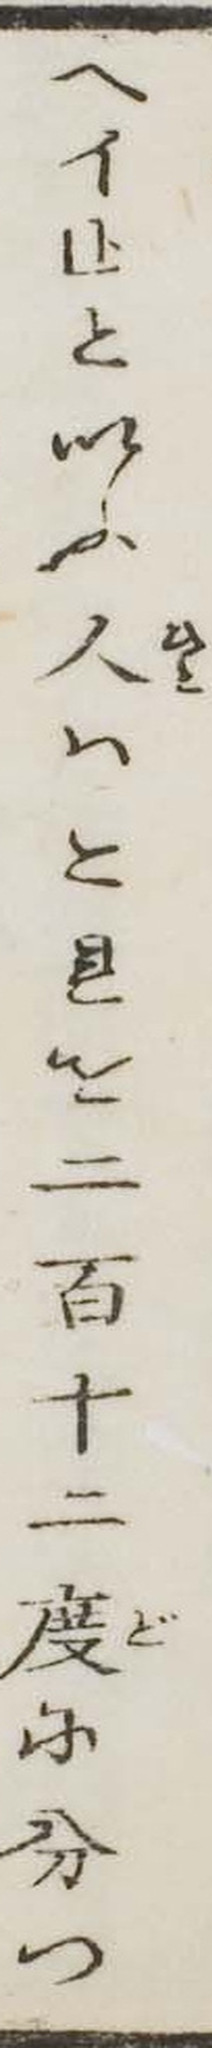ヘイト」といふ人はこれを二百十二度に分つ
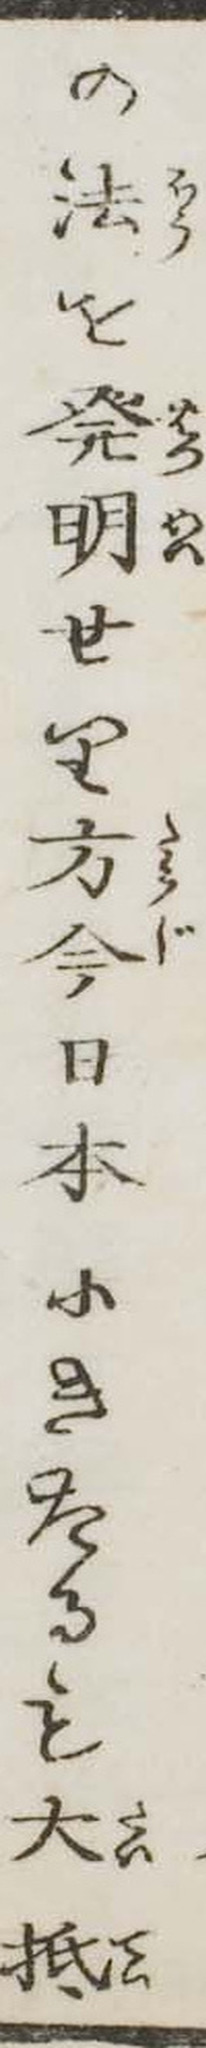の法を発明せり方今日本にきたるも大抵
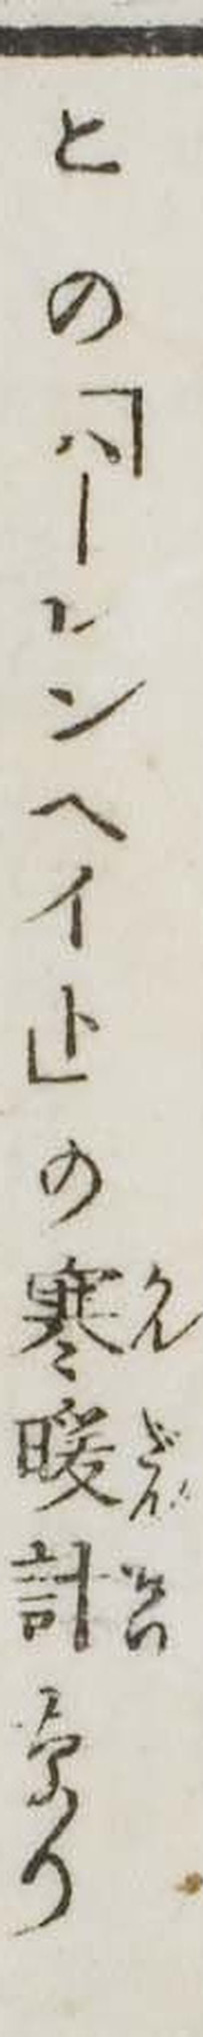この「ハーレンヘイト」の寒暖計なり
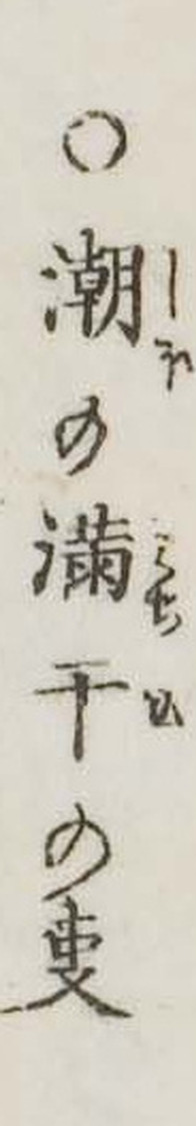◯潮の満干の叓
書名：究理知慧の勧 : 訓蒙画入 巻之2
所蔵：東京学芸大学附属図書館
